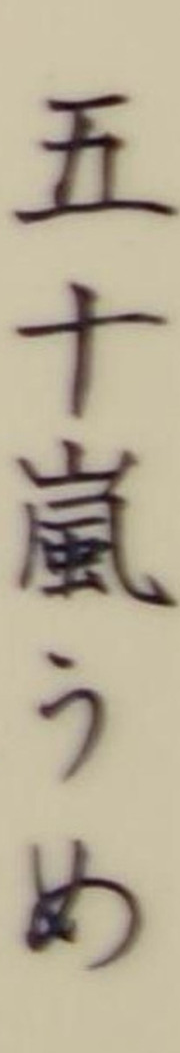五十嵐うめ
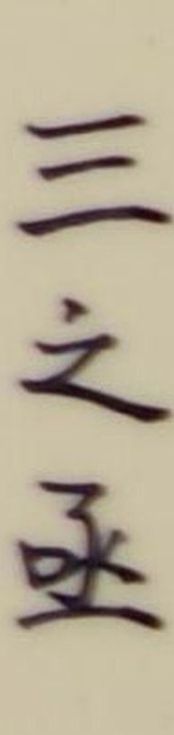三之丞
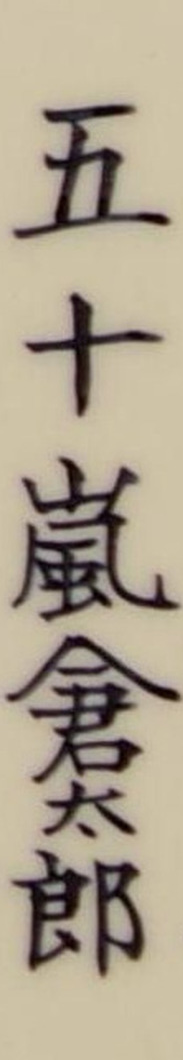五十嵐倉太郎
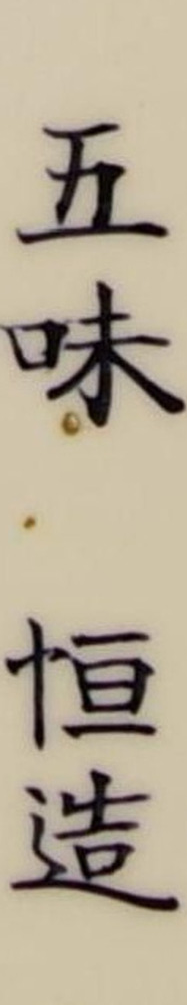五味恒造
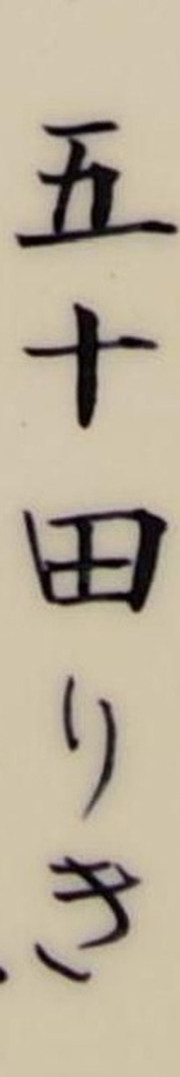五十田りき
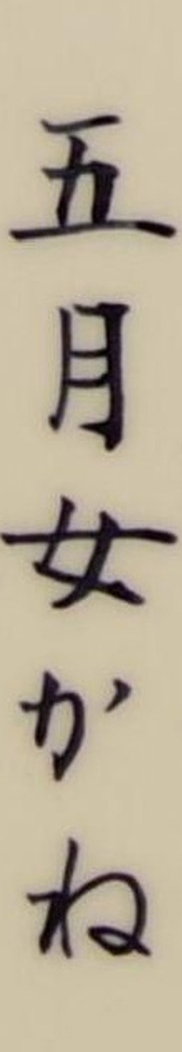五月女かね
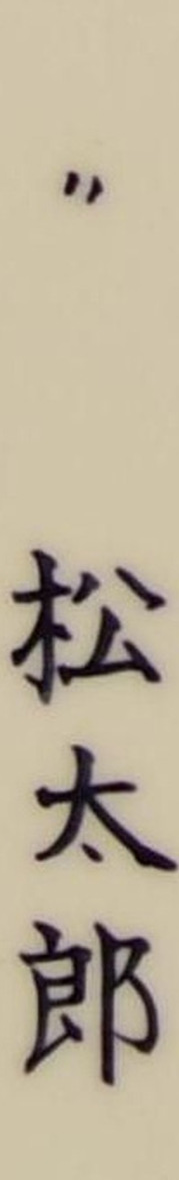松太郎
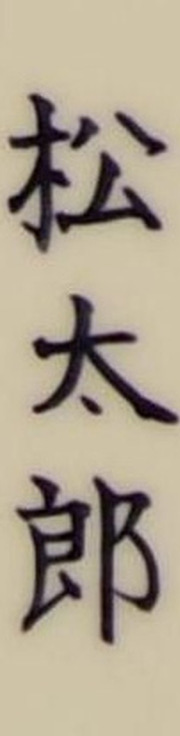松太郎
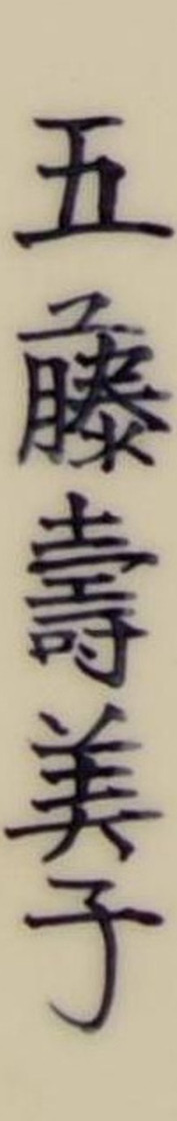五藤壽美子
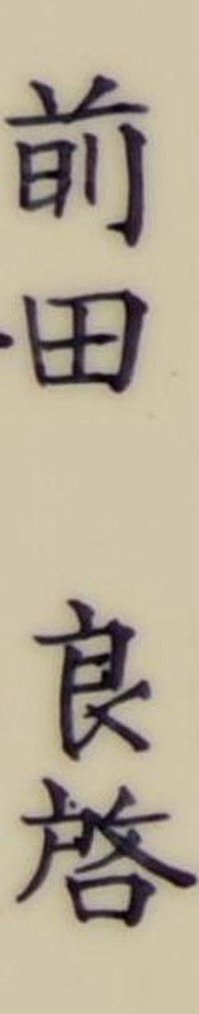前田良啓
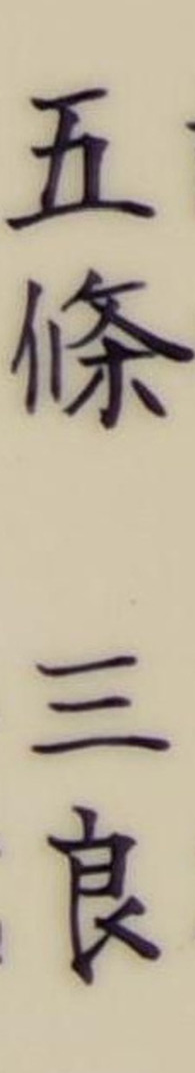五條三良

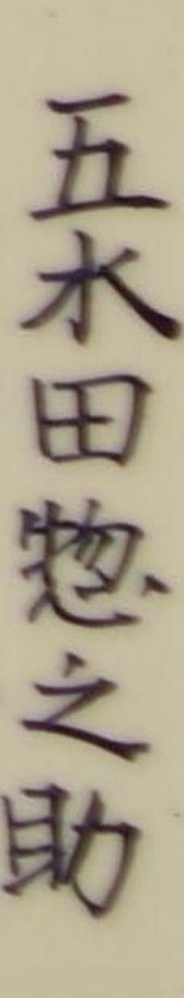五木田惣之助
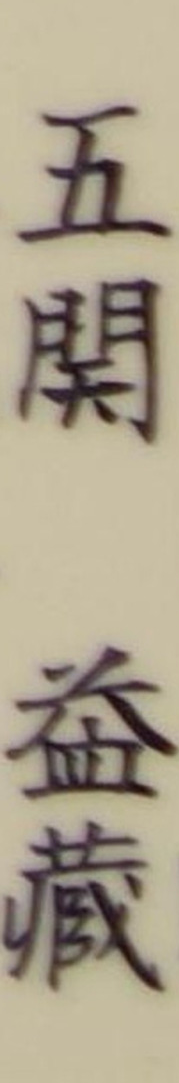五閑益蔵
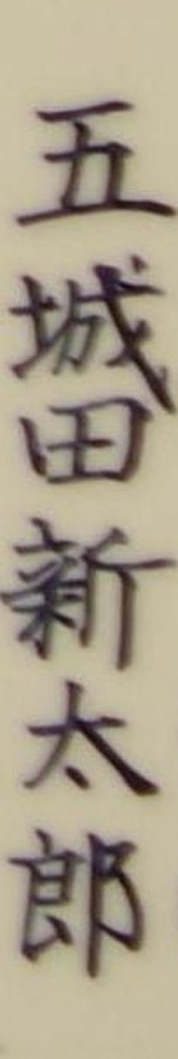五城田新太郎
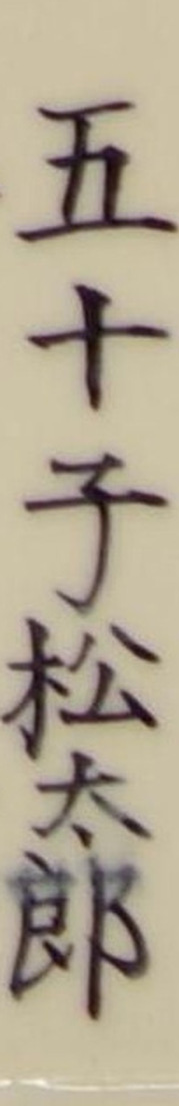五十子松太郎
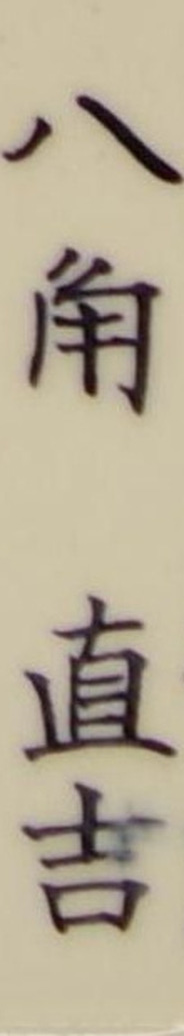八角直吉
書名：E~L
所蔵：高野山金剛峯寺
